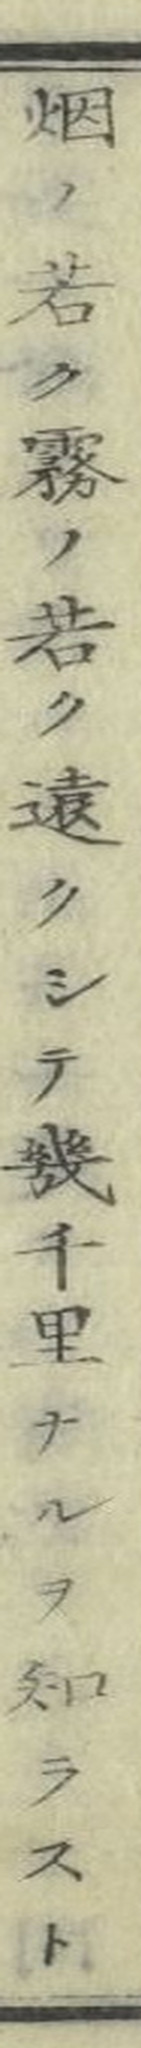烟ノ若ク霧ノ若ク遠クシテ幾千里ナルヲ知ラスト
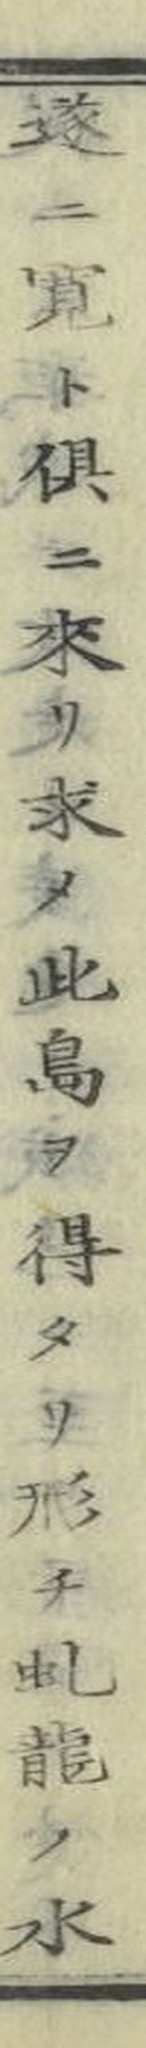遂ニ寛ト俱ニ來リ求メ此島ヲ得タリ形チ虱龍ノ水
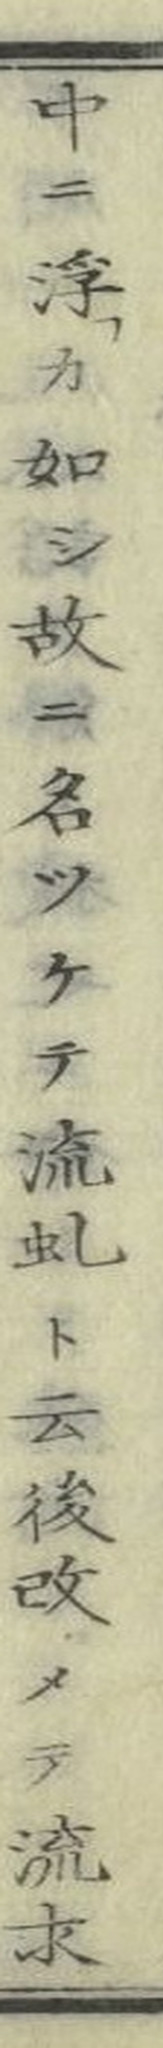中ニ浮カ如シ故ニ名ツケテ流虬ト云後改メテ流求
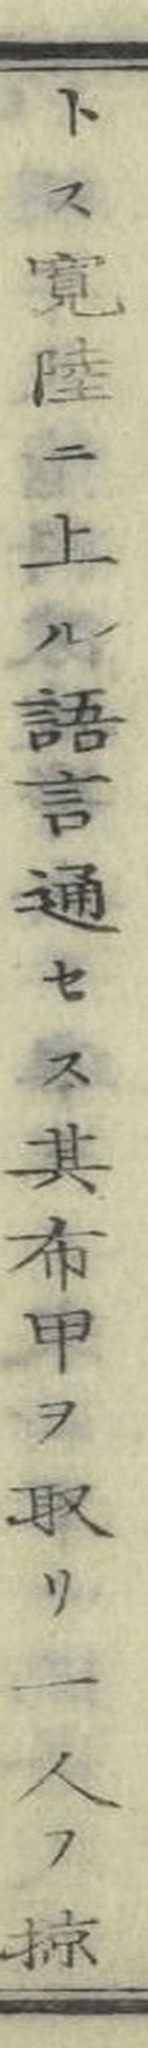トス寛陸ニ上ル語言通セス其布甲ヲ取リ一人ヲ掠
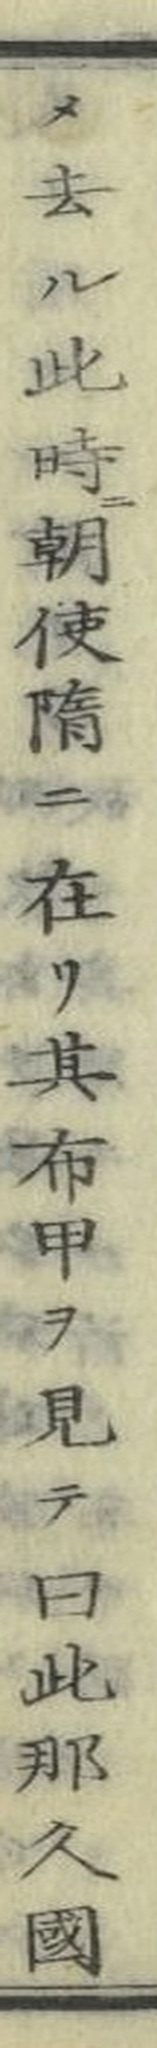メ去ル此時朝使隋ニ在リ其布甲ヲ見テ曰此那久國

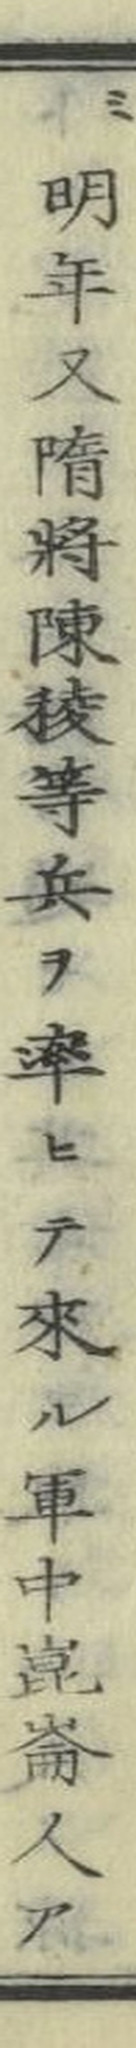ミ明年又隋將陳稜等兵ヲ率ヒテ來ル軍中崑崙人ア
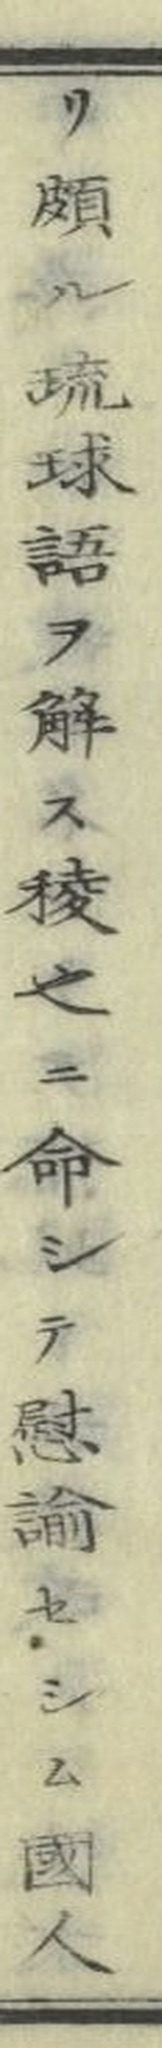リ頗ル琉球語ヲ解ス稜之ニ命シテ慰諭セシム國人
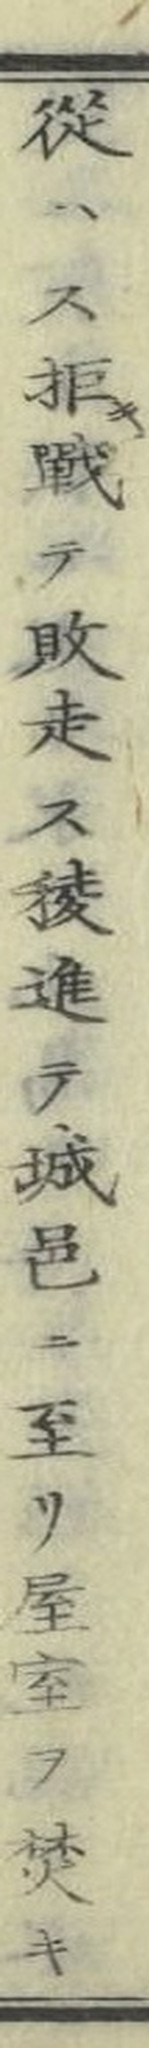從ハス拒戰テ敗走ス稜進テ城邑ニ至リ屋室ヲ焚キ
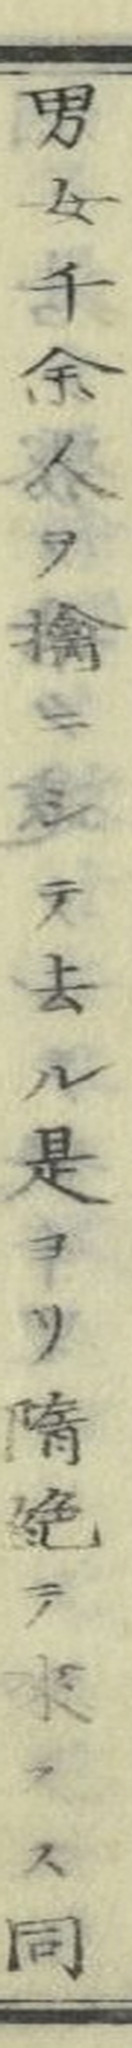男女千余人ヲ擒ニシテ去ル是ヨリ隋絶テ來ラス同
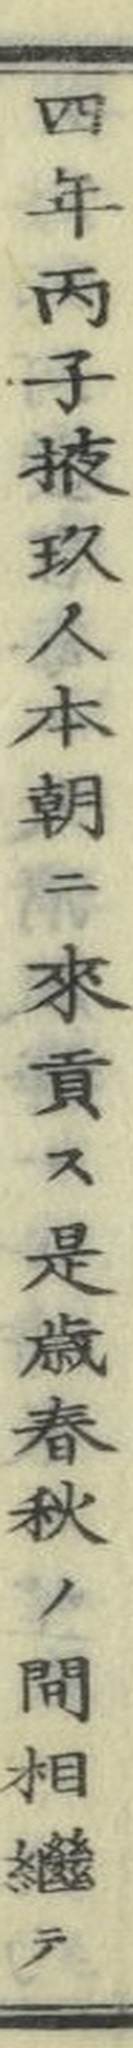四年丙子掖玖人本朝ニ來貢ス是歳春秋ノ間相繼テ
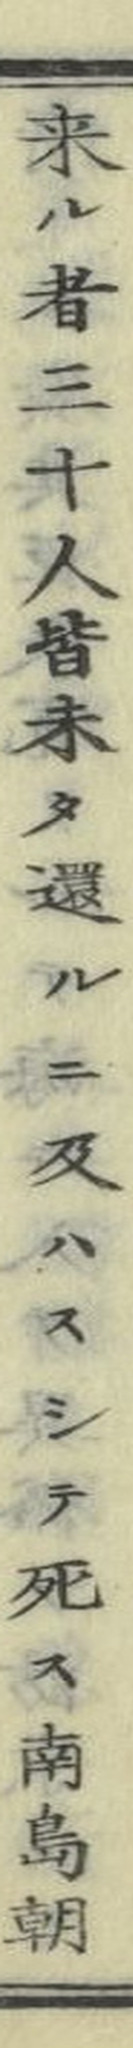来ル者三十人皆未タ還ルニ及ハスシテ死ス南島朝
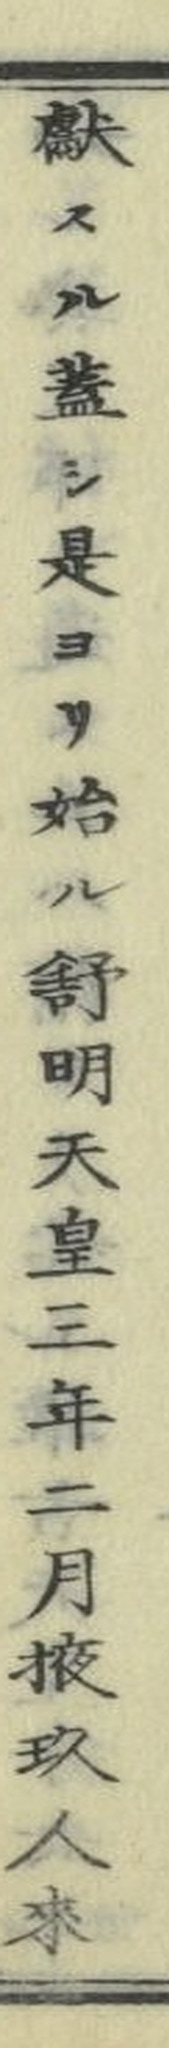獻スル蓋シ是ヨリ始ル舒明天皇三年二月掖玖人來
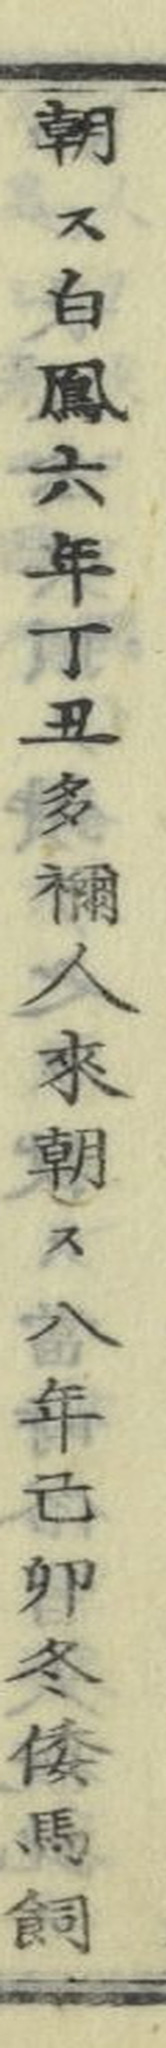朝ス白鳳六年丁丑多禰人來朝ス八年已卯冬倭馬飼
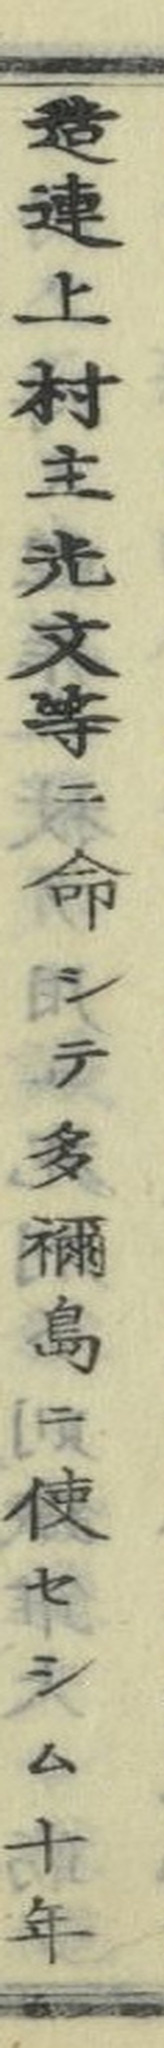造連上村主光文等ニ命シテ多禰島ニ使セシム十年
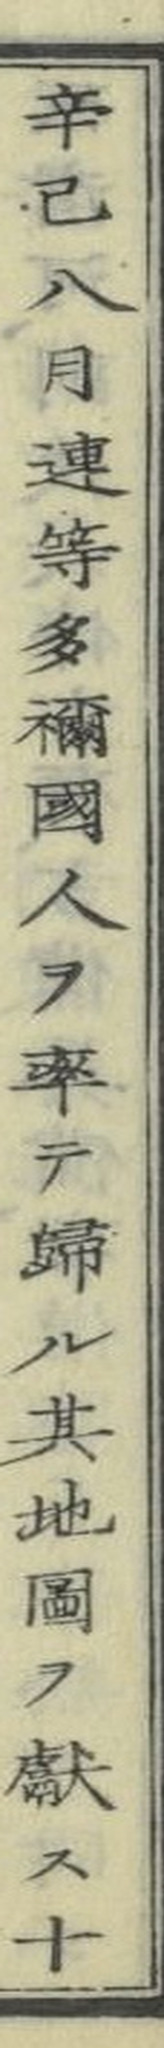辛巳八月連等多禰國人ヲ率テ歸ル其地圖ヲ獻ス十
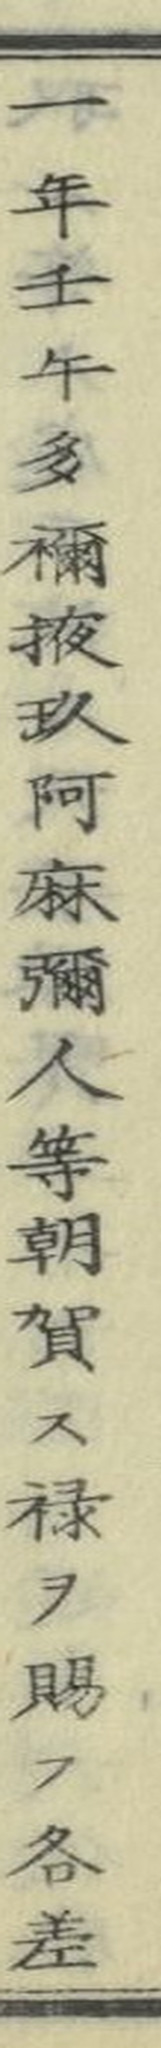一年壬午多禰掖玖阿麻彌人等朝賀ス祿ヲ賜フ各差
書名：琉球藩史 一之巻
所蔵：University of the Ryukyus Library
